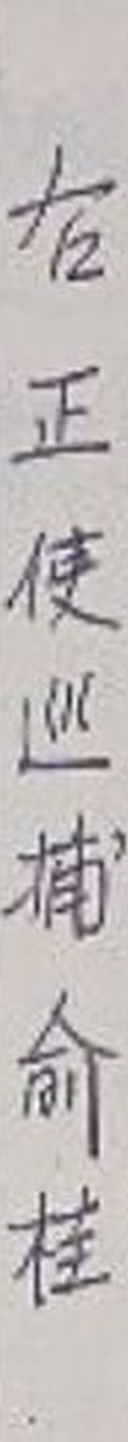右正使巡捕兪桂
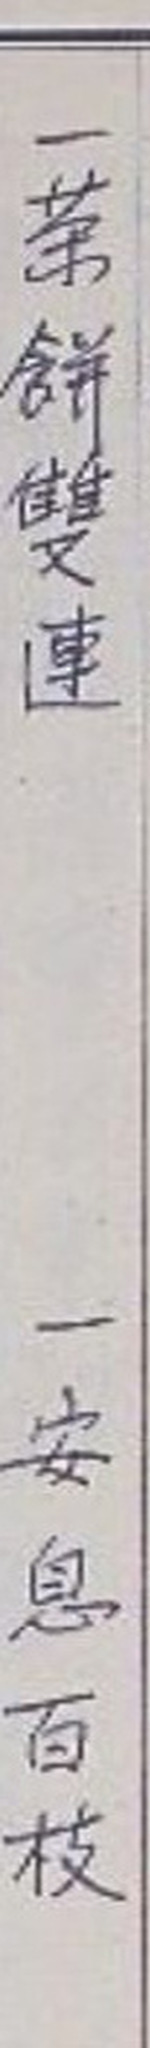一茶餅雙連一安息百枝
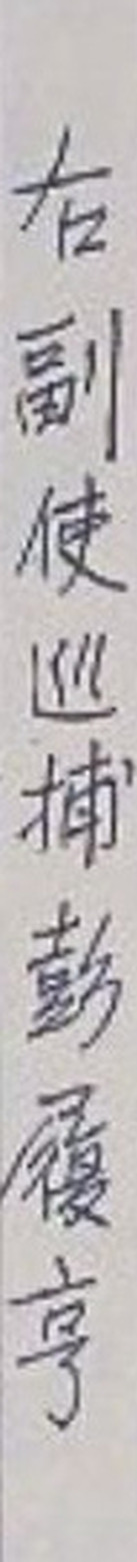右副使巡捕彭履亨
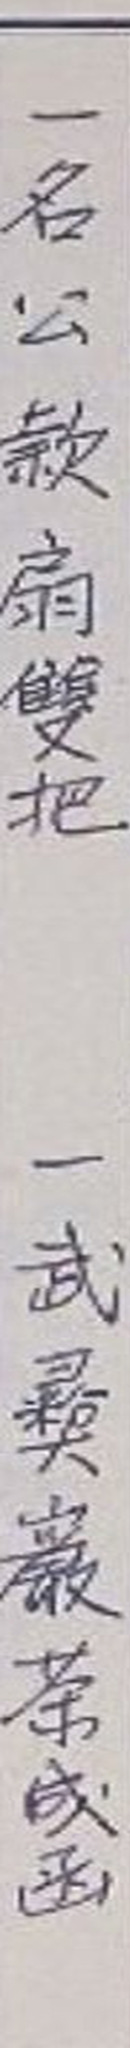一名公款扇雙把一武彛巖茶成函
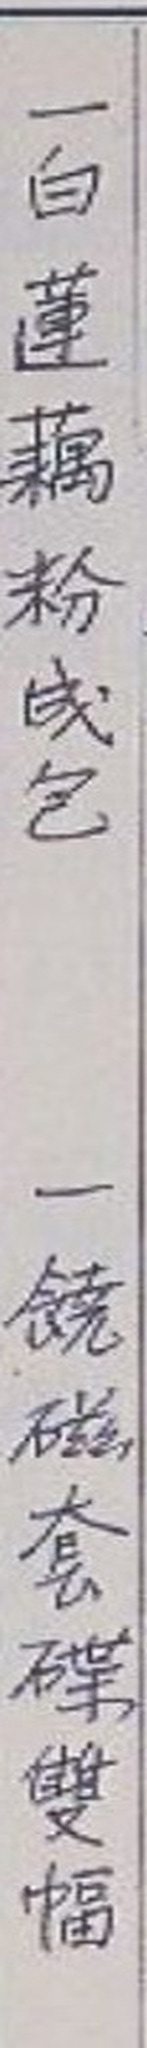一白蓮藕粉成包一饒磁套碟雙幅
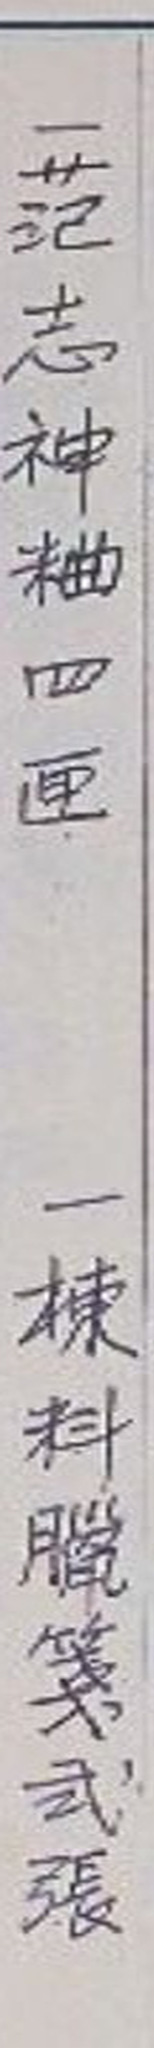一范志神粬四匣一棟料臘箋弐張
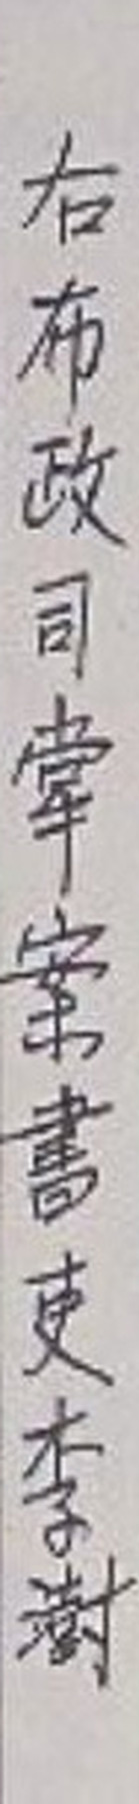右布政司掌案書吏李澍
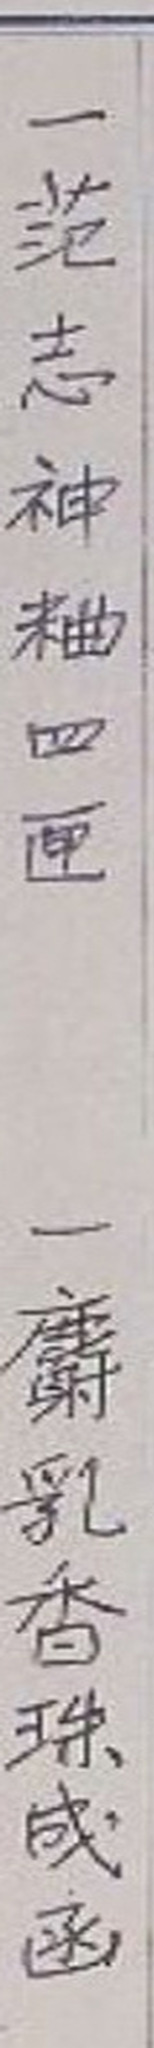一范志神粬四匣一麝乳香珠成函

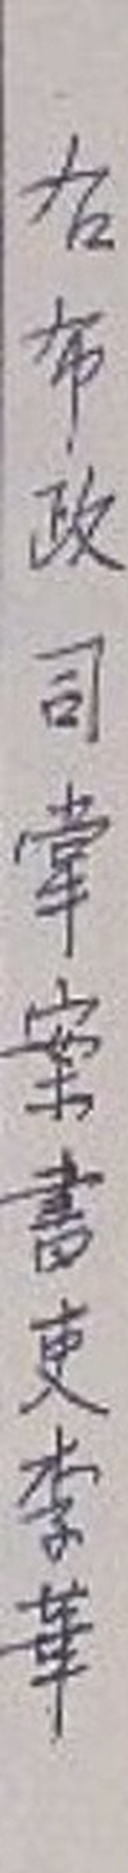右布政司掌案書吏李華
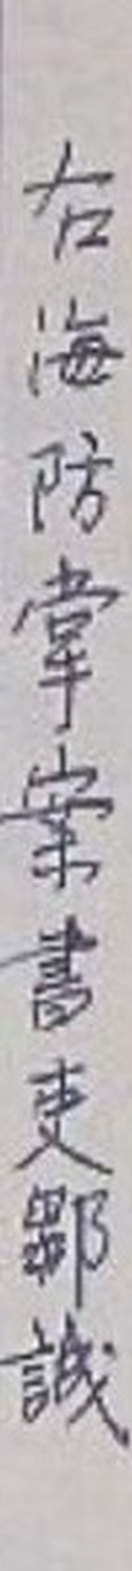右海防掌案書吏鄒誠
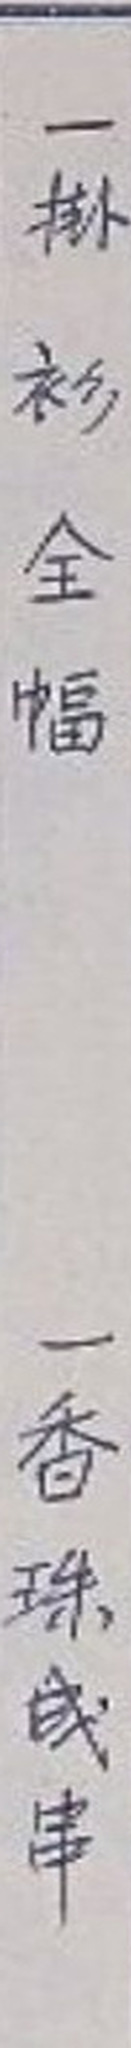一掛衫全幅一香珠成串
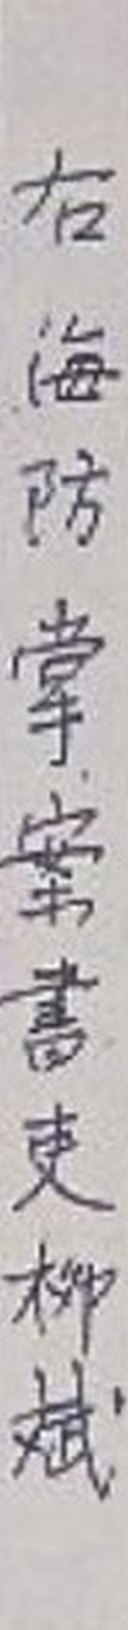右海防掌案書吏柳斌
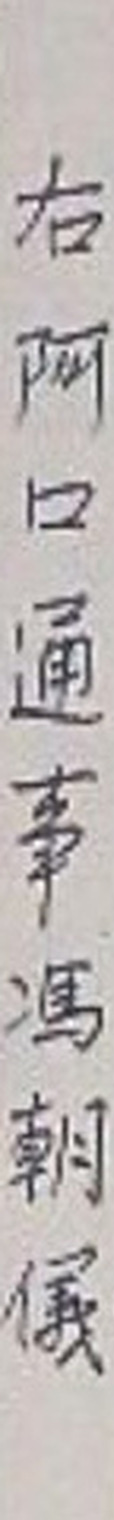右阿口通事馮朝儀
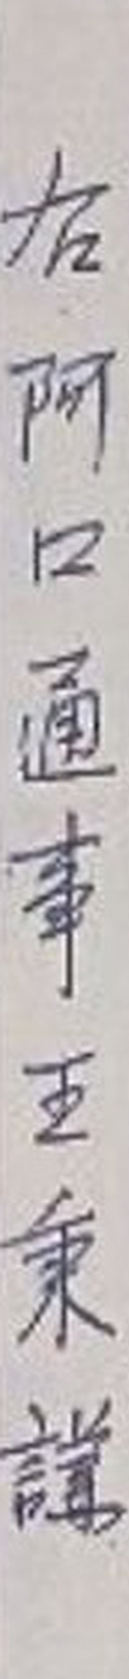右阿口通事王秉謙
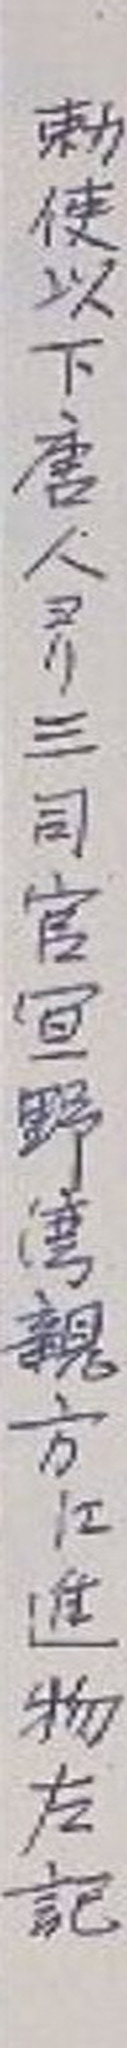勅使以下唐人より三司官宜野湾親方え進物左記
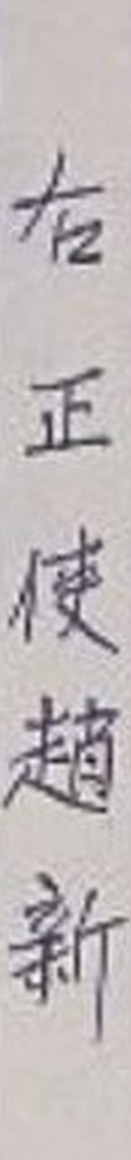右正使趙新
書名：支那冊封使来琉諸記 下巻
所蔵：University of the Ryukyus Library
